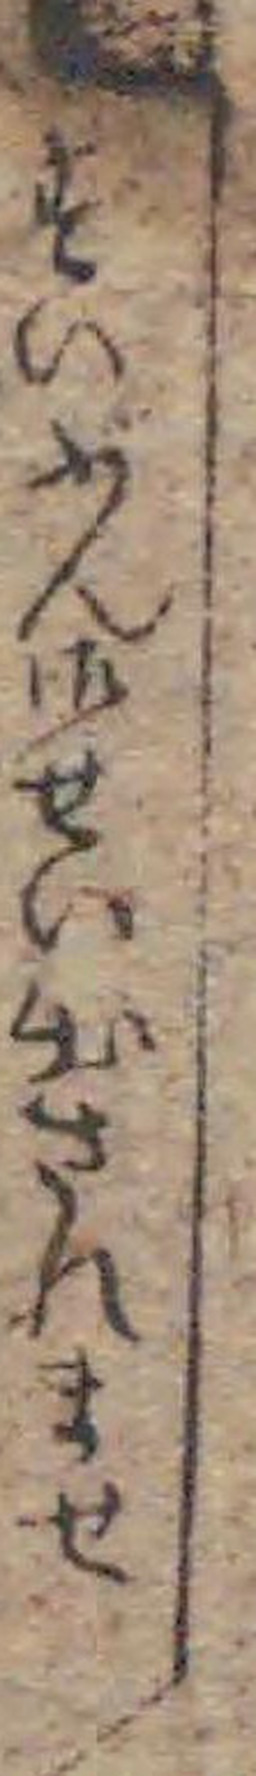ずいぶん御せい出されませ
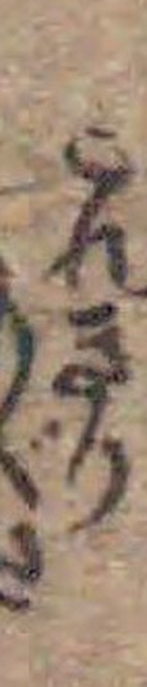これきり
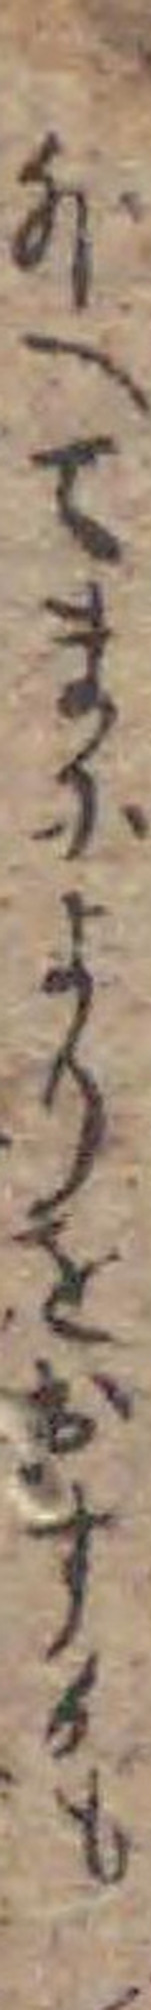外へてまによりをおすよりも
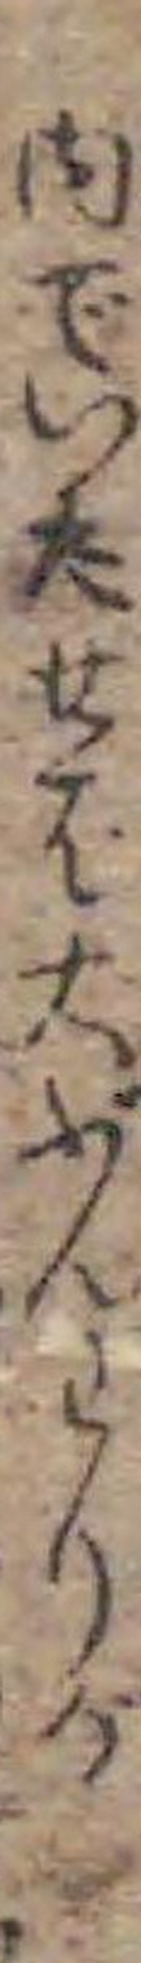内でいたせば大ぶんわりが
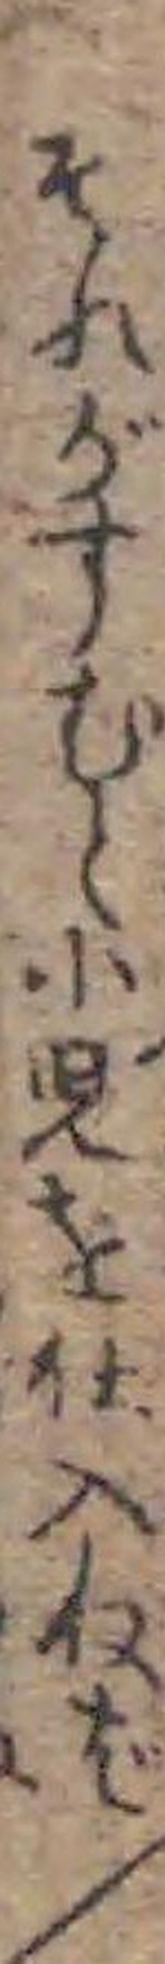それがすむと小児を仕入ねば
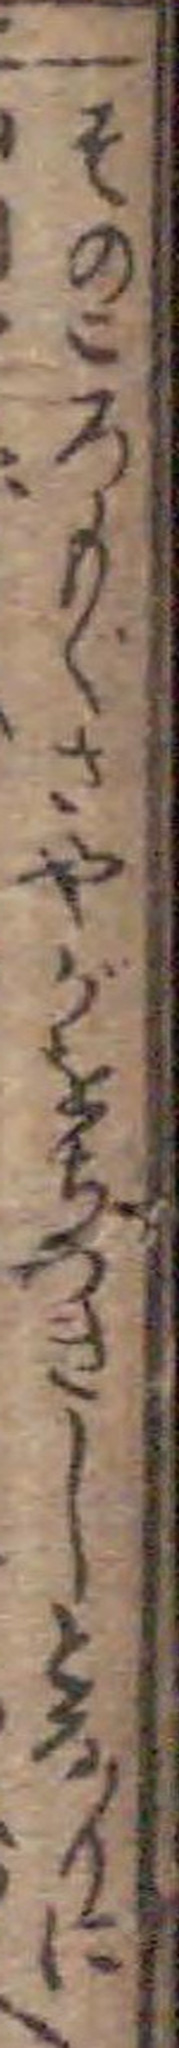そのころもぐさやがをちつきしとなりに
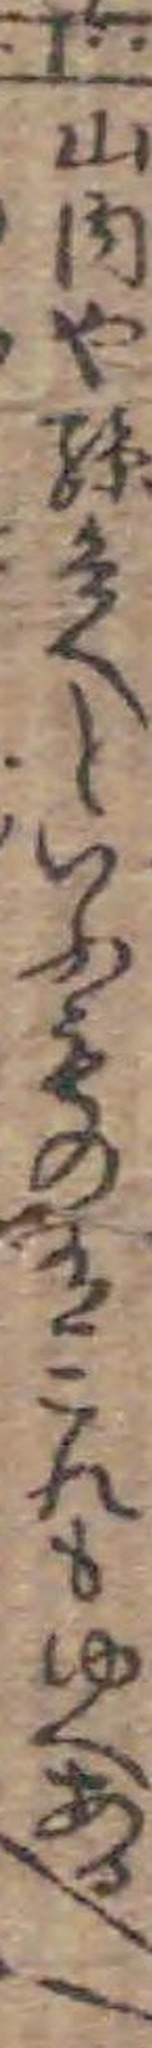山内や孫兵へといふもの有これもゆへある
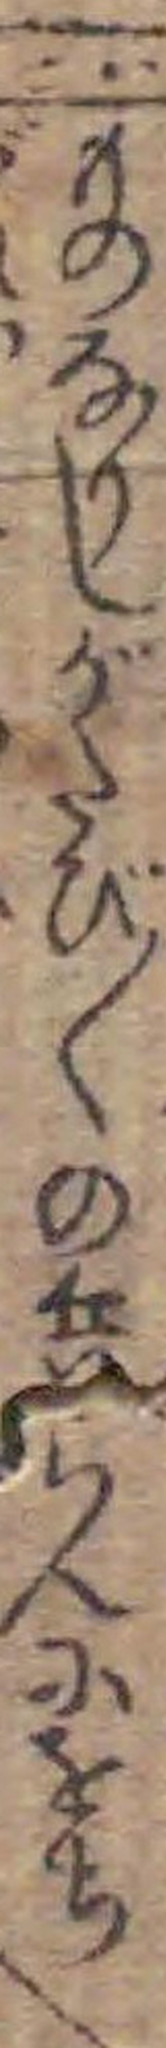ものなりしがたび〳〵の兵らんにをち
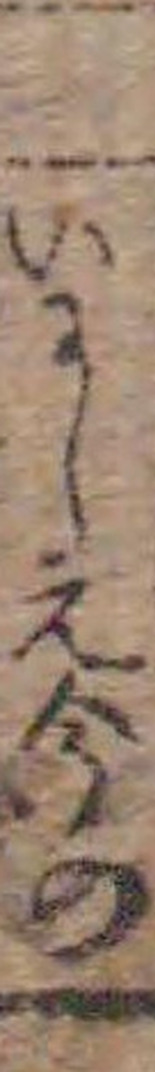いにしえ今の
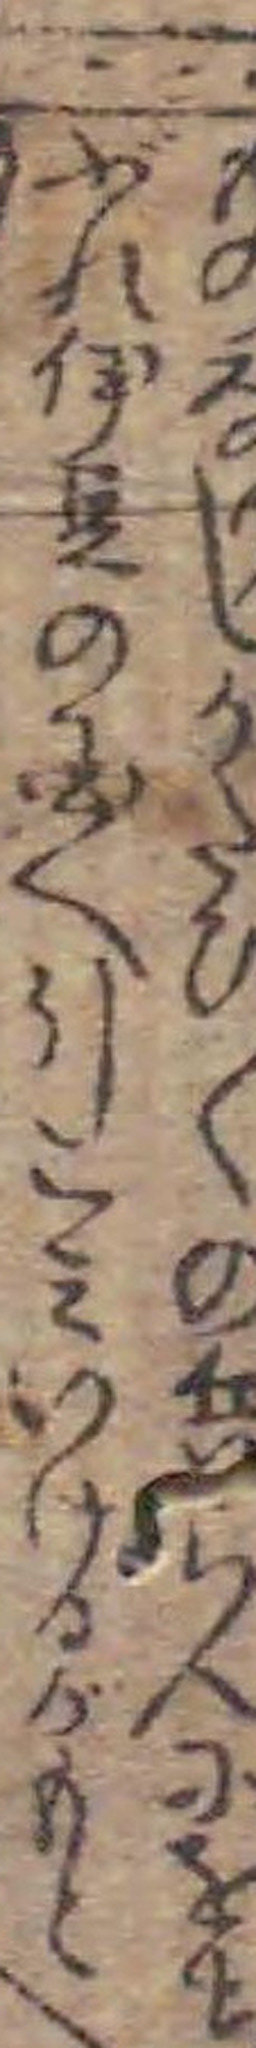ぶれ伊豆の国へ引こみいけるがもと
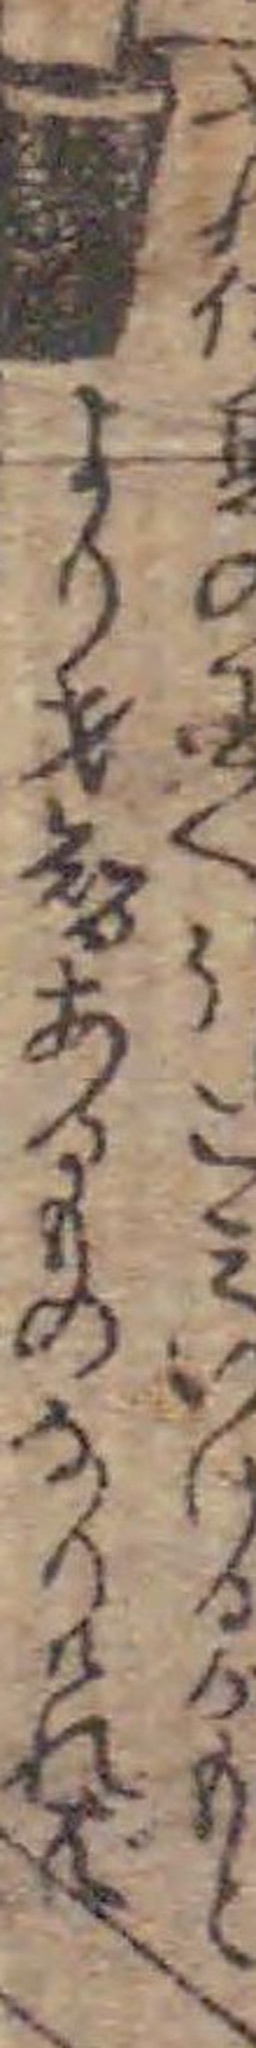より才智あるものなりければ
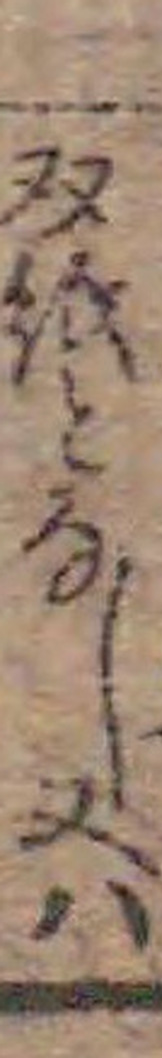双紙となし又は
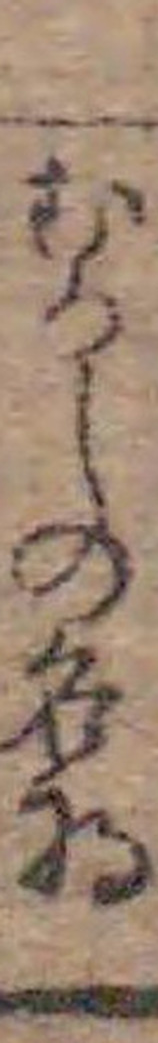むかしの名将
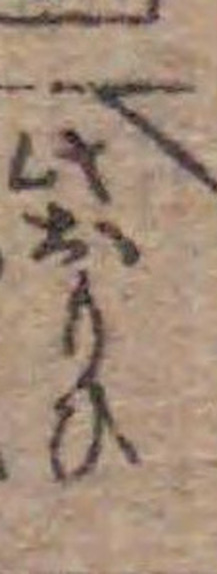此おもひ
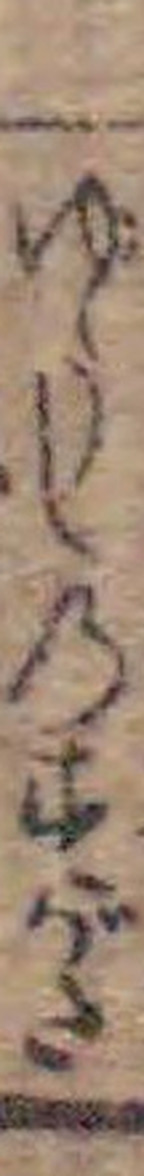ゆうしのすがた
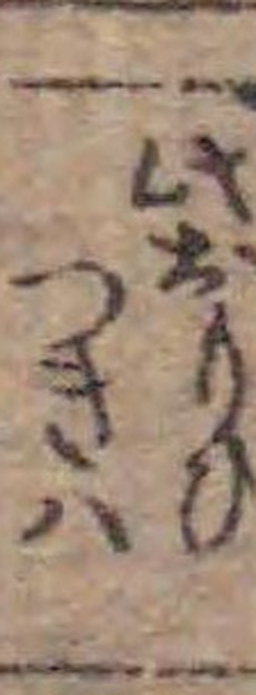つきは
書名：三舛増鱗組 : 3巻
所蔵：国立国会図書館 National Diet Library, JAPAN
